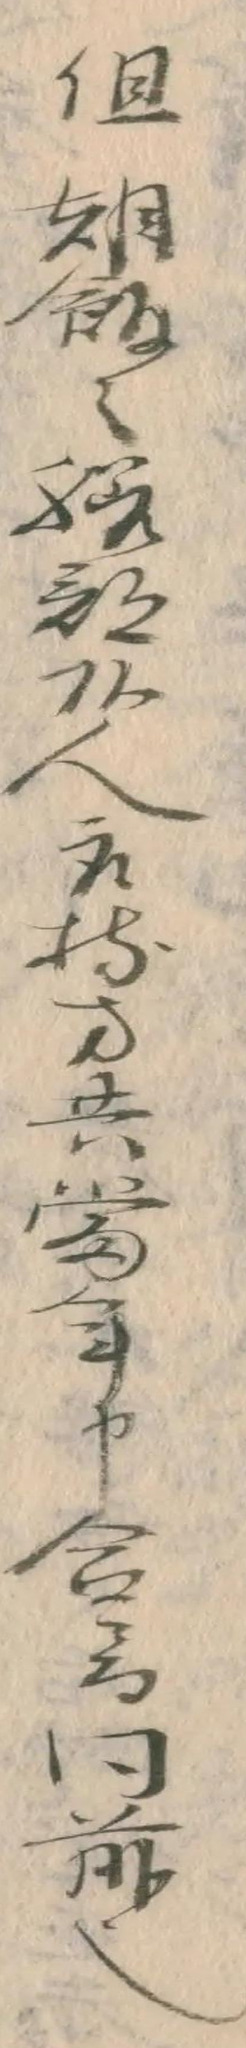但朝飯之膳部頭人取持方共當年申合ニ而同前也
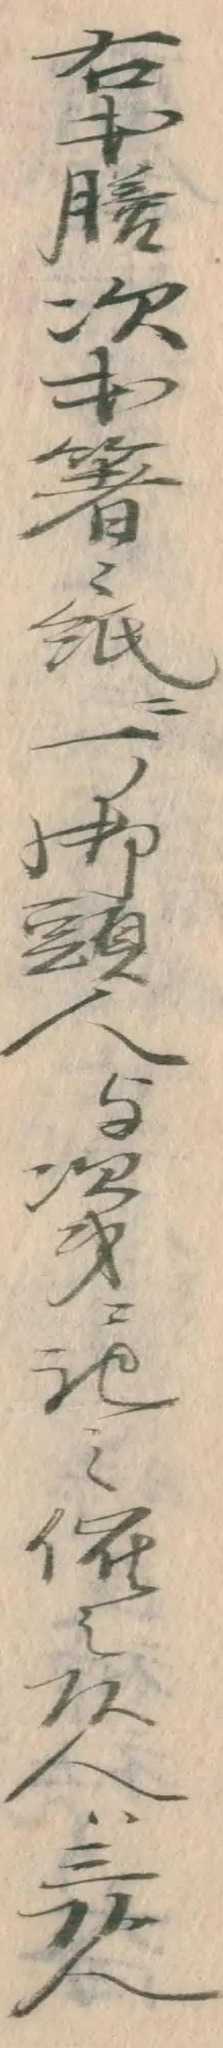右本膳次本箸之紙ニ一ノ御頭人与次第ニ記之併之候人ハ三頭人
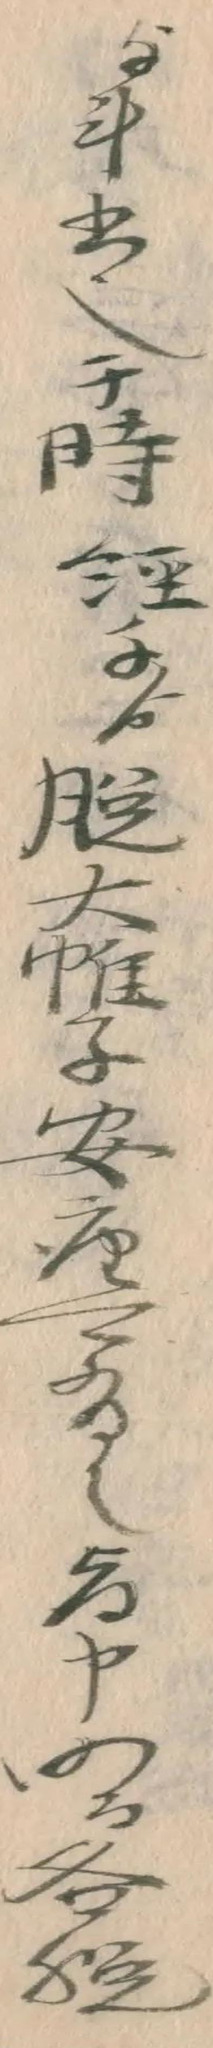と斗書也于時経千ゟ脱大帷子安座可有之旨申仍而各脱
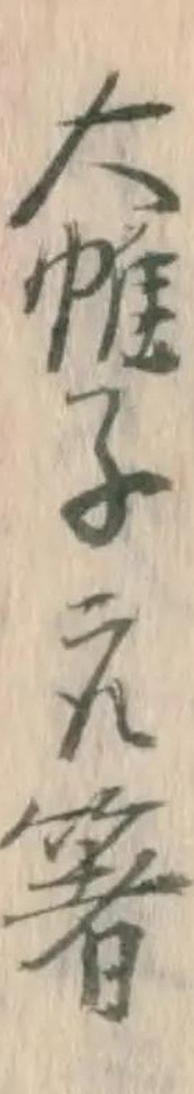大帷子取箸
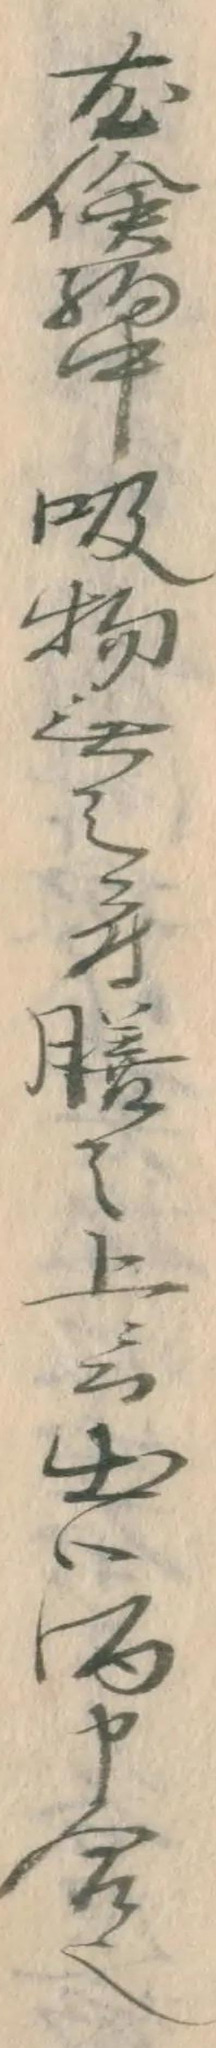尤倹約中吸物無之ニ付膳之上ニ而出ハ酒申合也

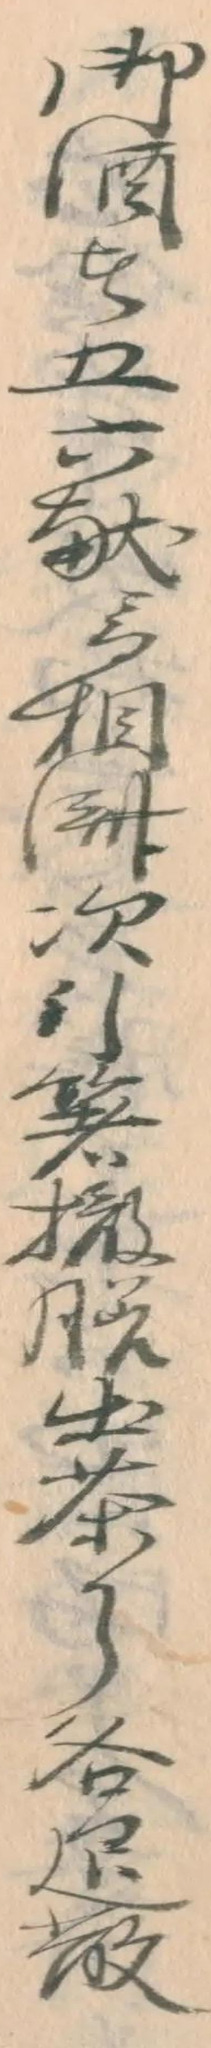御酒は五六献ニ而相済次引箸撒膳出茶了各退散
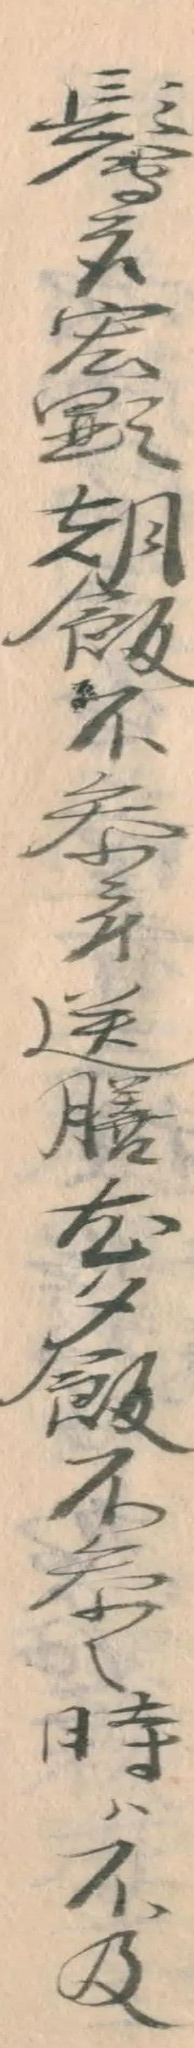一鬠取宏顕朝飯不参ニ付送膳尤夕飯不參之時ハ不及
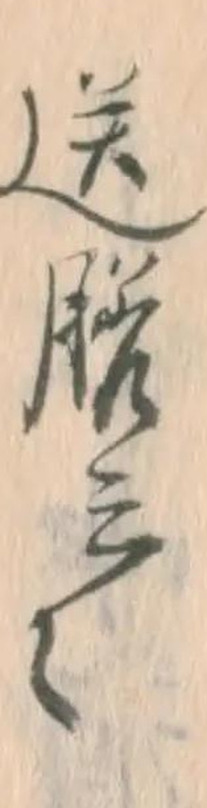送膳云々
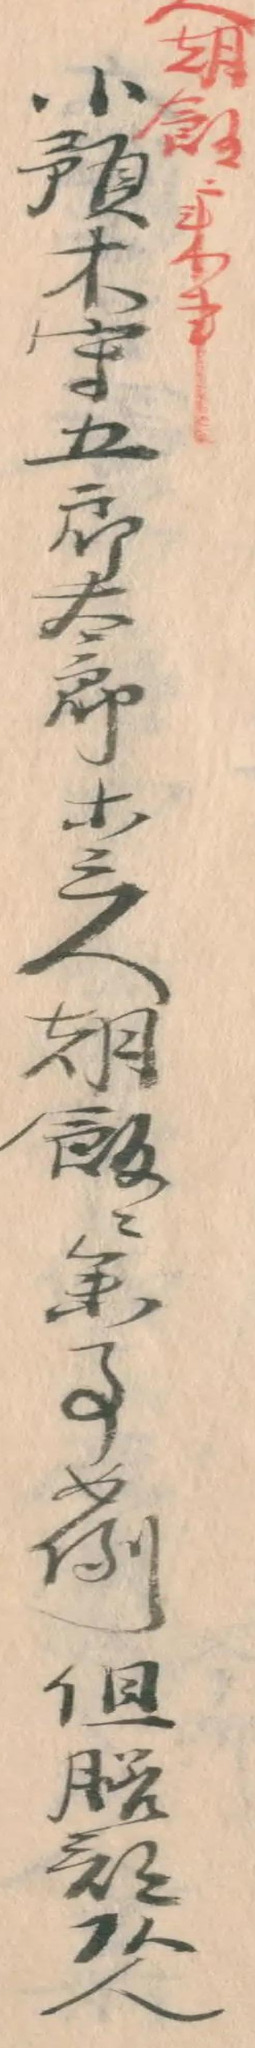一小預木守五郎太郎等三人朝飯ニ参事如例但膳部頭人
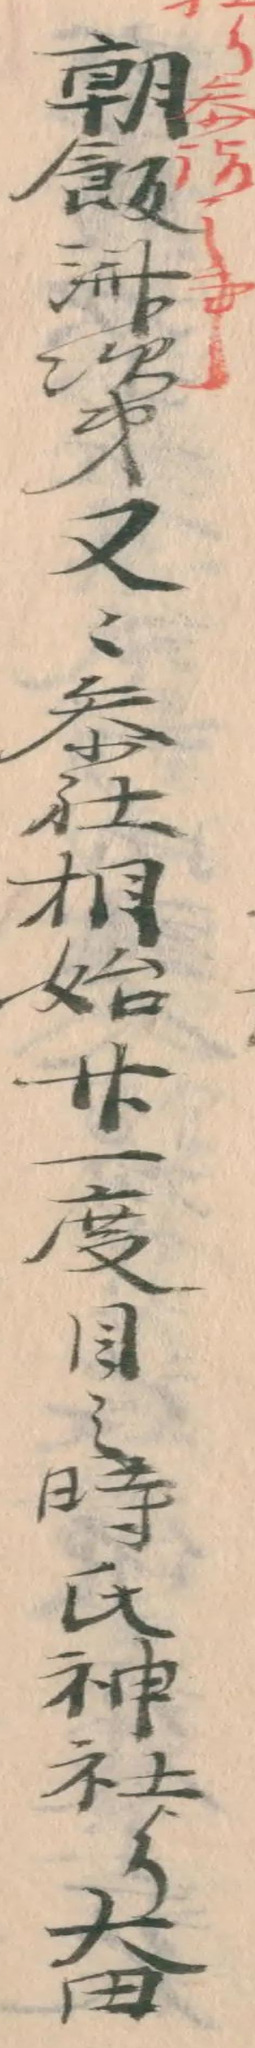一朝飯済次第又々参社相始廿一度目之時氏神社より大田
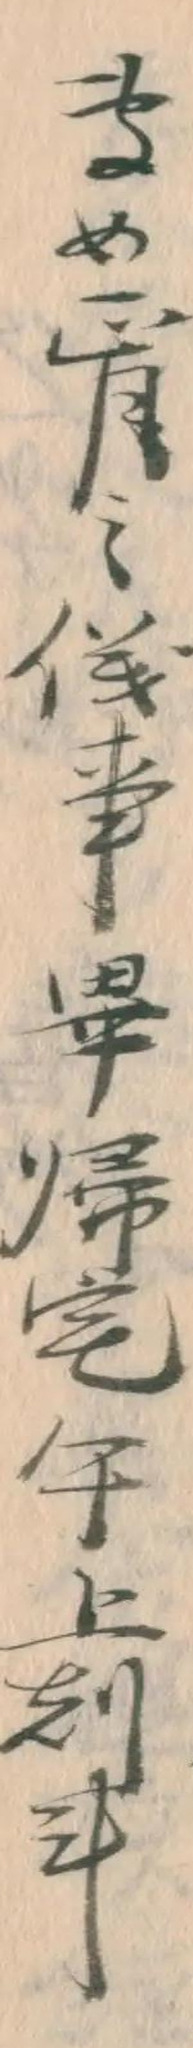専如正月之儀事畢帰宅午上刻斗
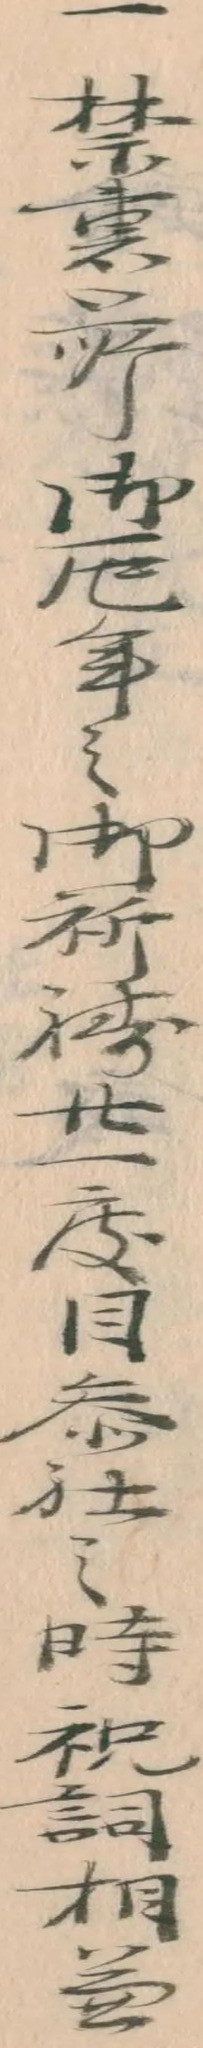一禁裏御所御厄年之御祈祷廿一度目参社之時祝詞相兼
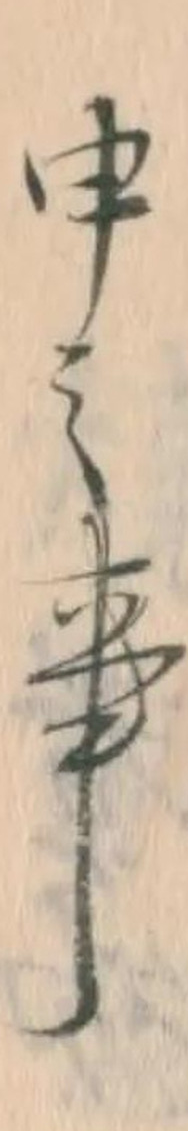申之事
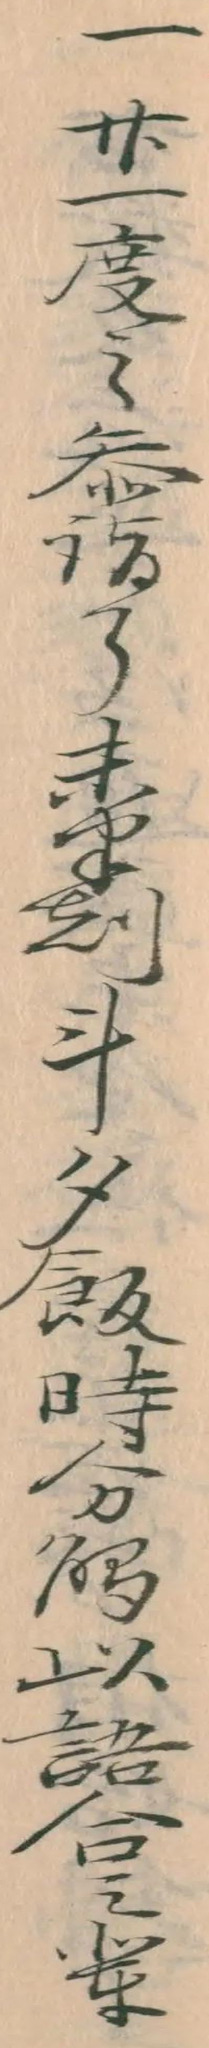一廿一度之参詣了未半刻斗夕飯時分觸以語合之輩
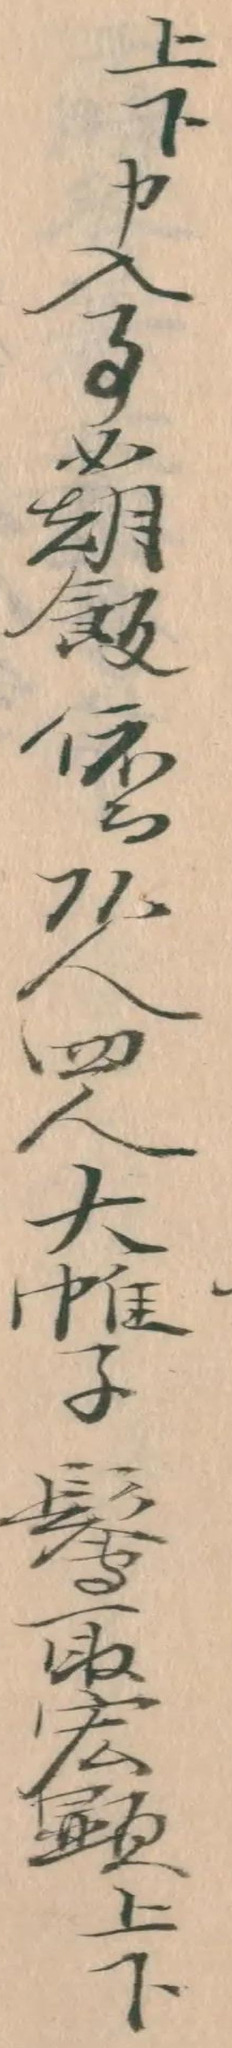上下申入事如朝飯依而負人四人大帷子髪取宏顕上下
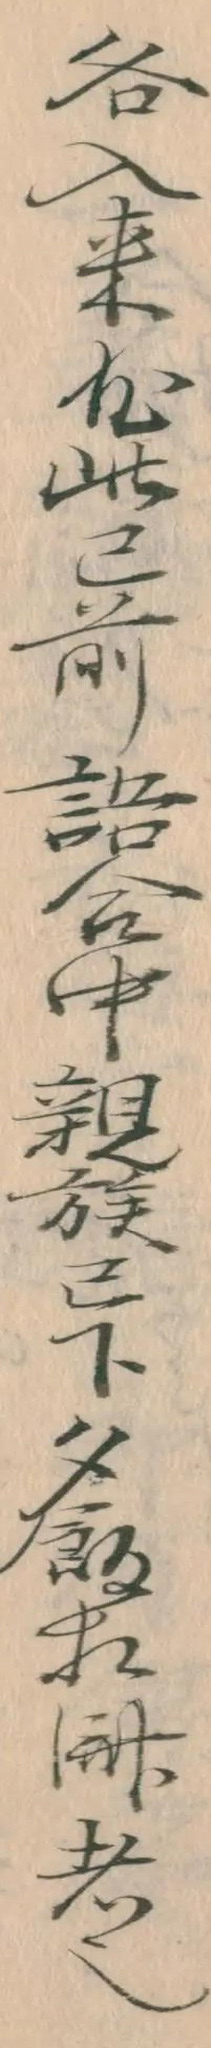各入来尤此已前語合中親族已下夕飯相済者也
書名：賀茂社記録. 第73冊
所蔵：国立国会図書館 National Diet Library, JAPAN
